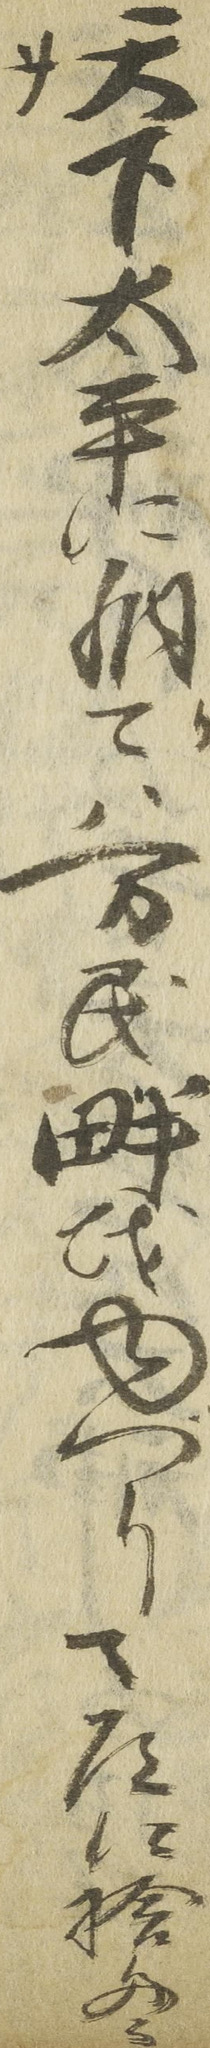天下太平に納りてハ万民畔をゆづりて道に捨たる
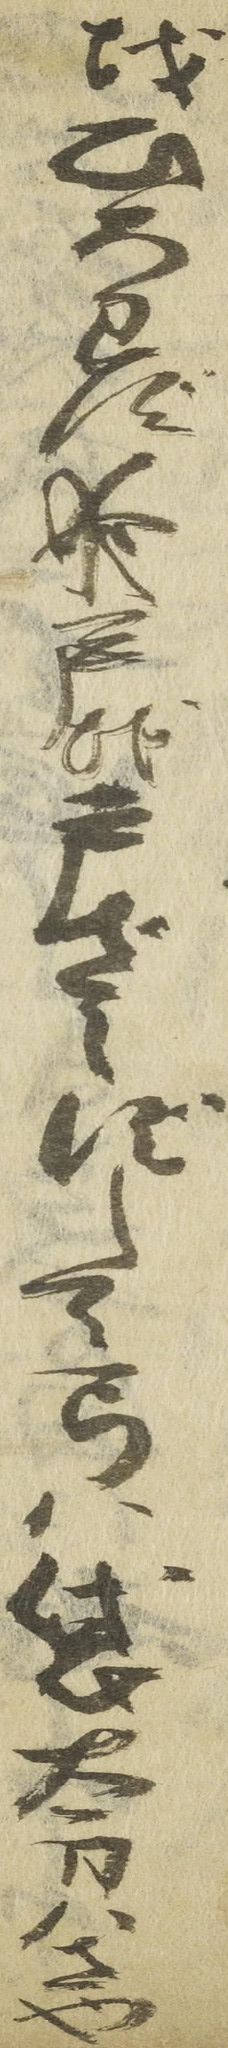をひろわず夜戸を戸ざゝずして弓ハ袋太刀ハさや
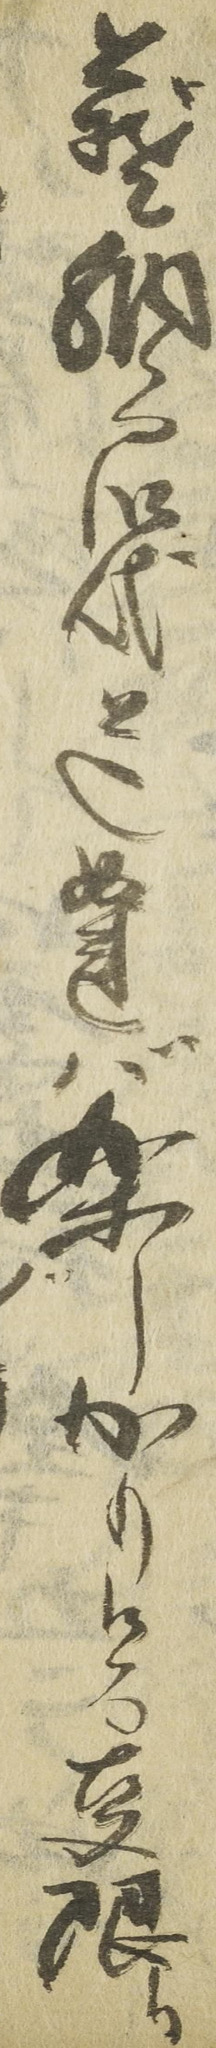とぞ納る御代と也ぬれバ楽しかりける事限り
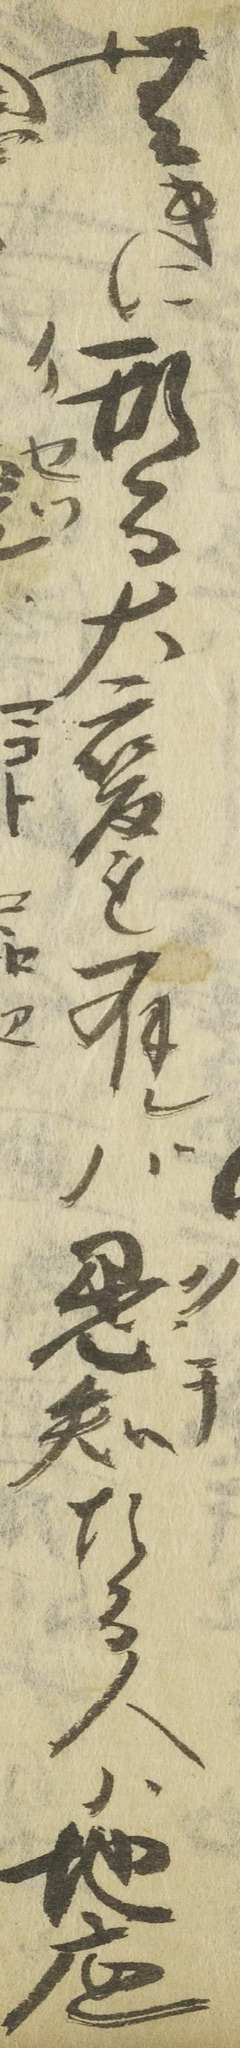無きに斯々る大変を有レバ愚知なる人ハ地底
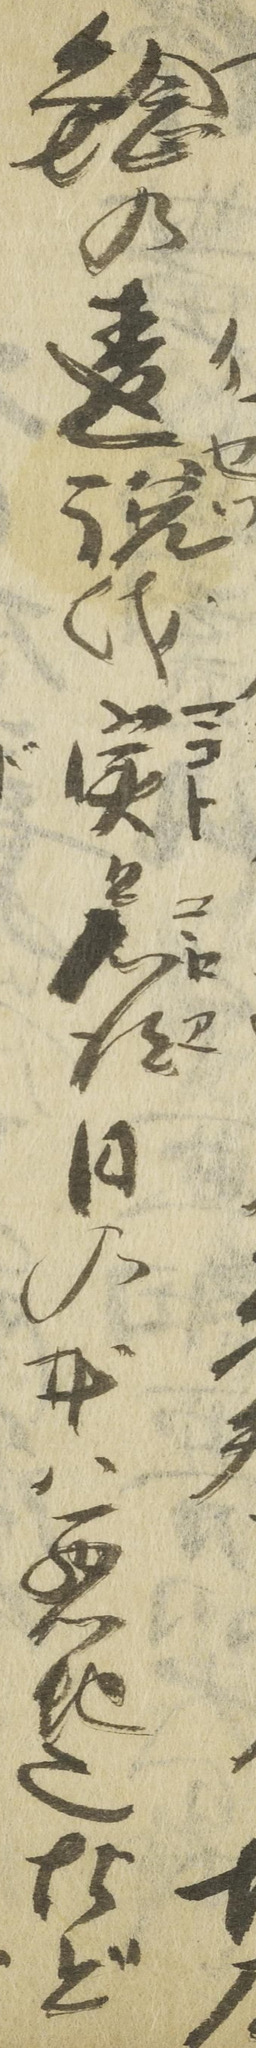鯰の違説を実と心得日の本ハ悪地也など
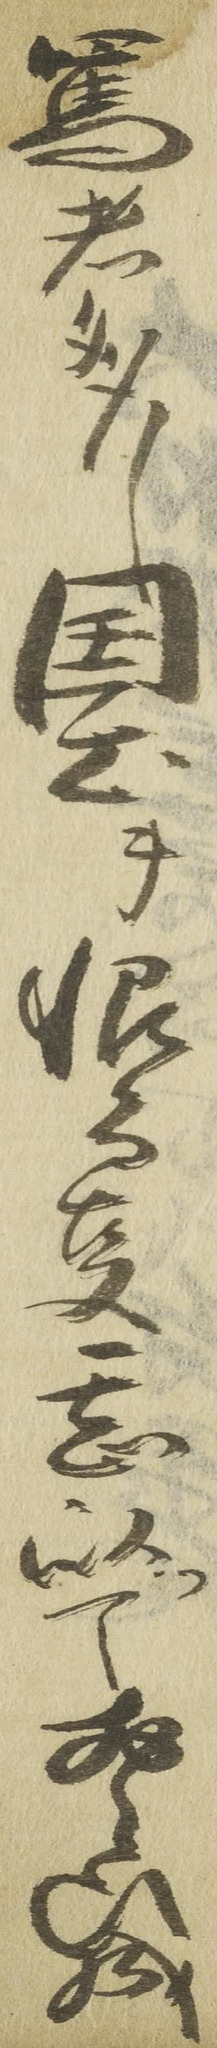罵者多し国土ヲ恨る事甚以ツておゝひ成
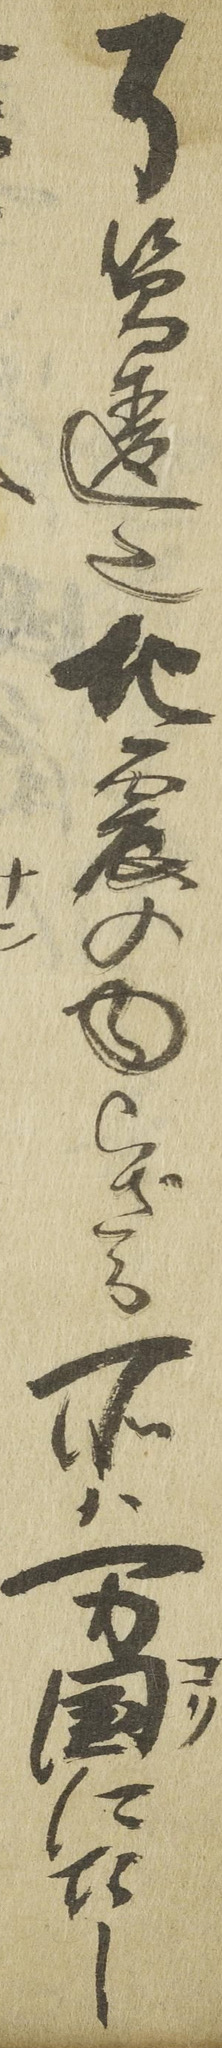了簡違也地震のゆらざる所ハ万国になし
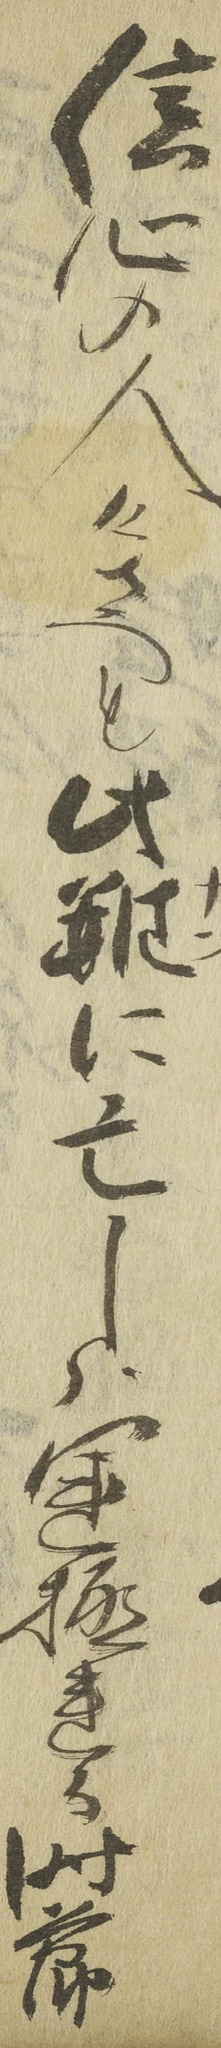信心の人々さへも此難に亡しハ運極れる時節
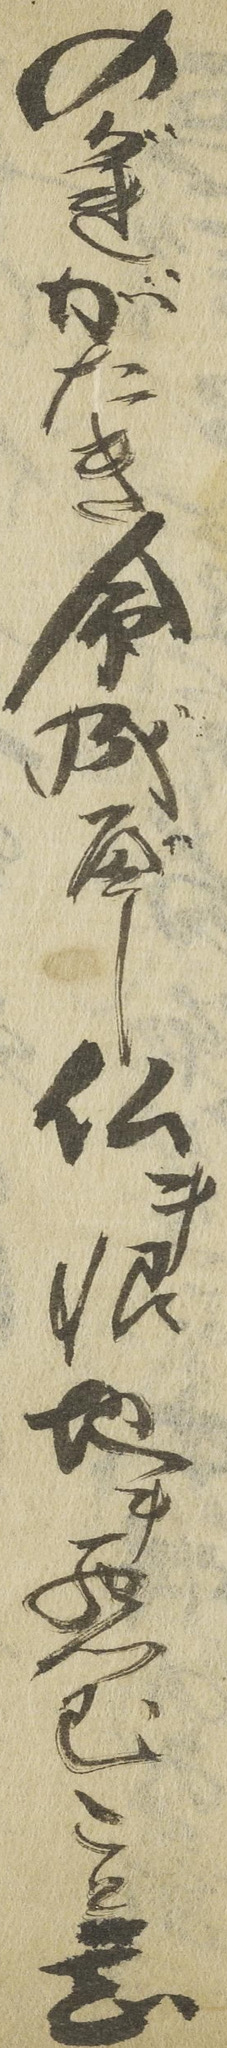のがれがたき命成べし仏ヲ恨地ヲ悪むこと甚
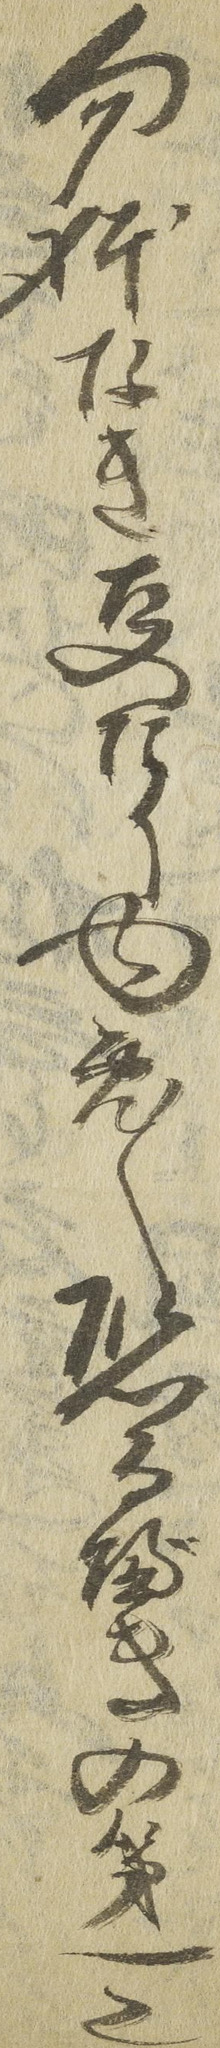勿体なき事なりゆめ〳〵恐るべきの第一也
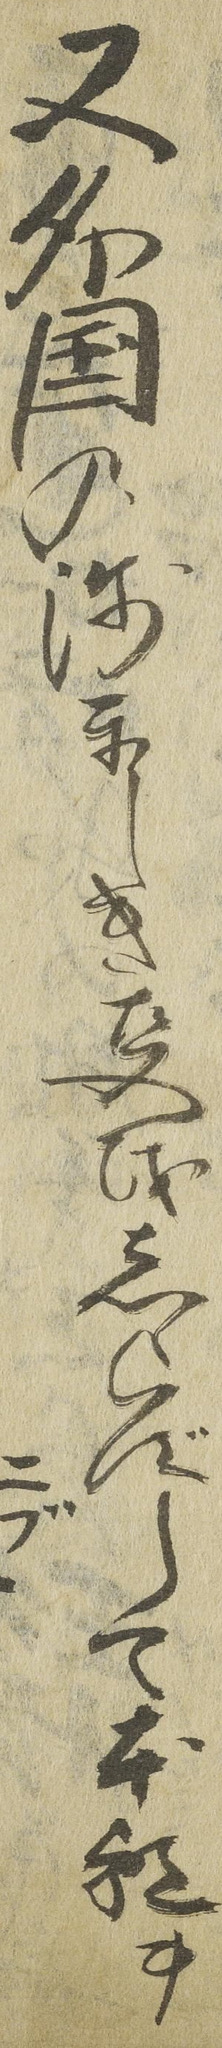又外国の浅ましき事をしらずして本朝ヲ
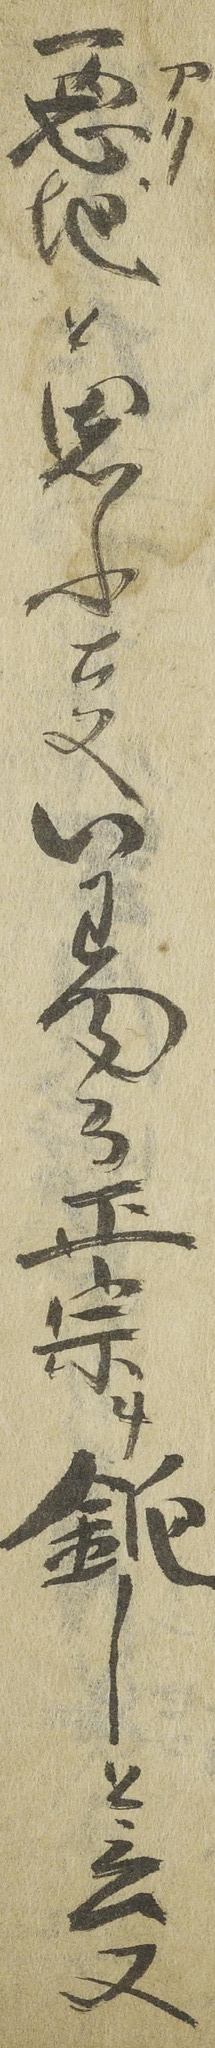悪地と思ふ事いわゆる正宗ヲ鈍しと言又
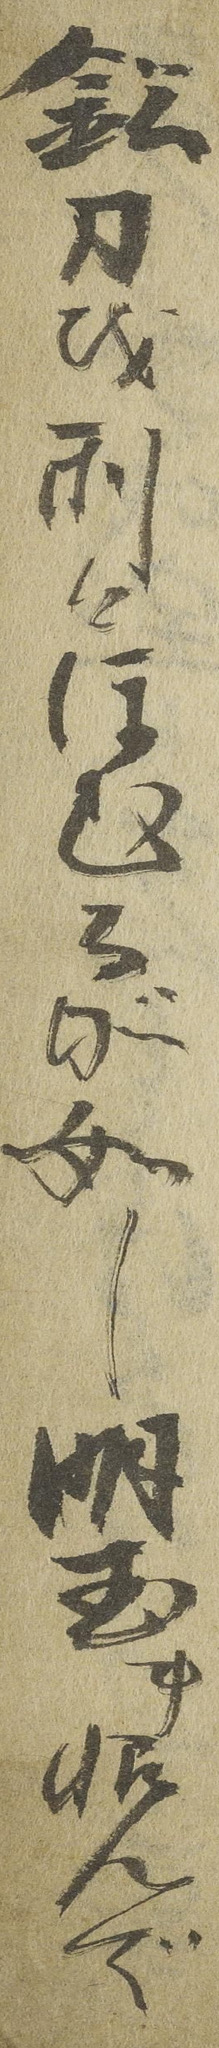鉛刀を利とほむるが如し明玉ヲ恨んで

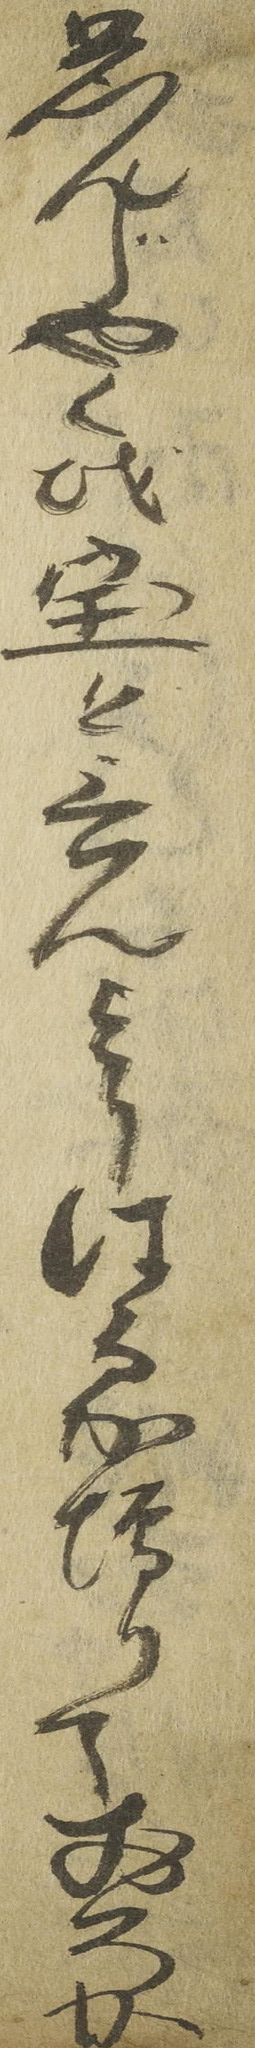ゑんじゃくを宝と言んよりはるか増りておろか
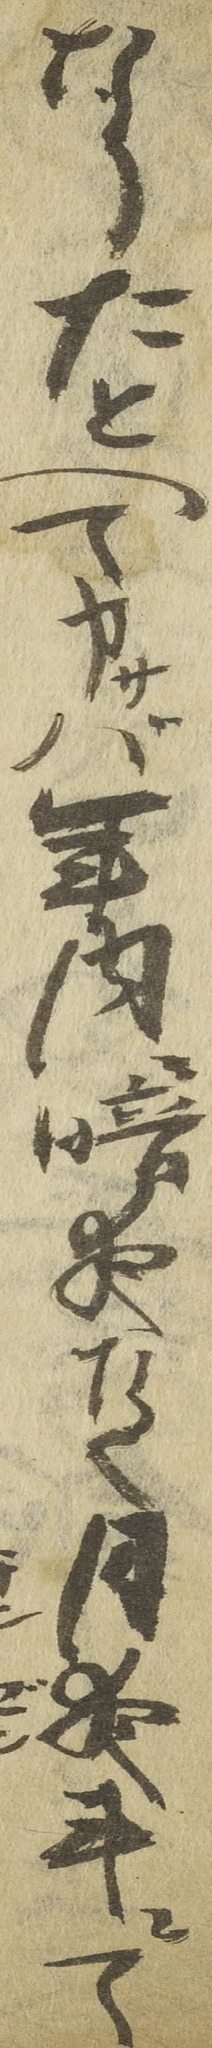なりたとへて申サバ年内ニ暗夜なく月夜計とて
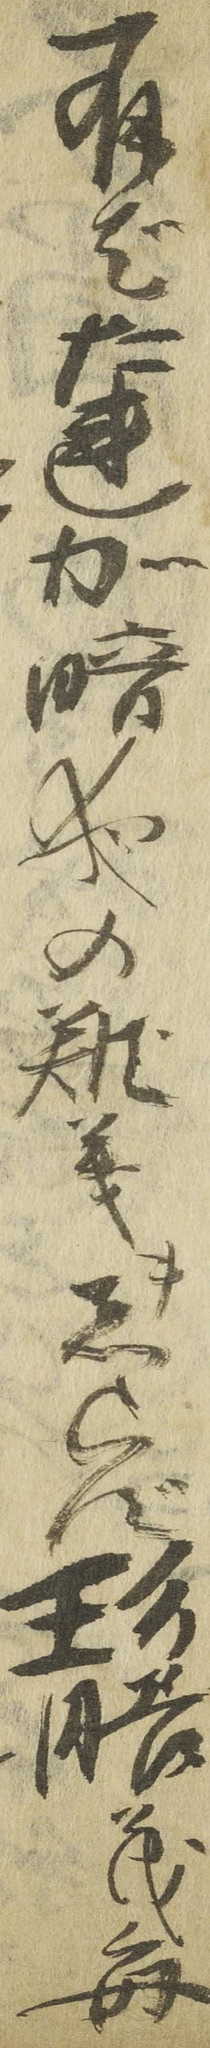有ぞたれが暗夜の難義ヲしらず珍膳も毎
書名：善光寺地震聞書
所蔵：東京大学地震研究所図書室 Earthquake Research Institute Library, The University of Tokyo, JAPAN
